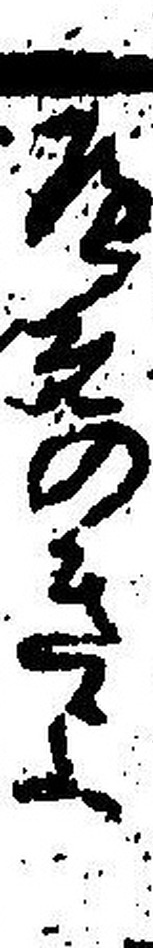へそのきよ
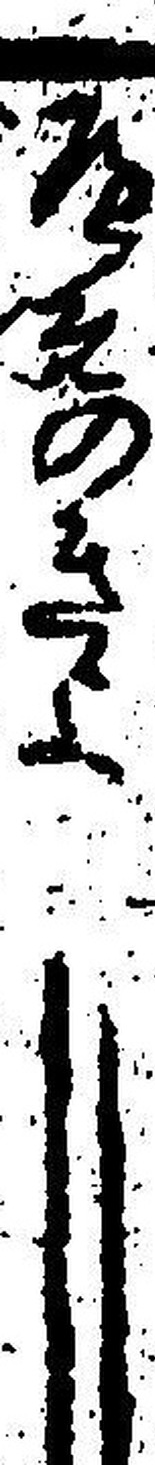へそのきよ
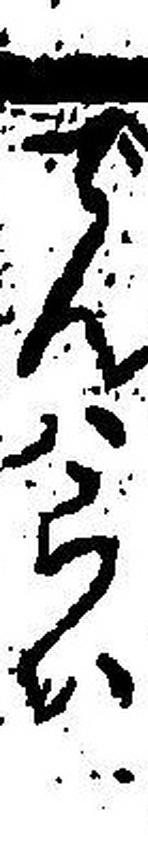でんはらい
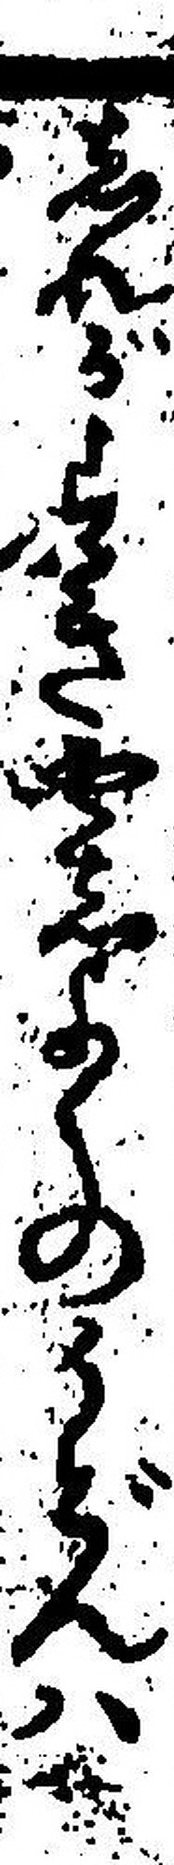しんがすきやしよくのうどんは
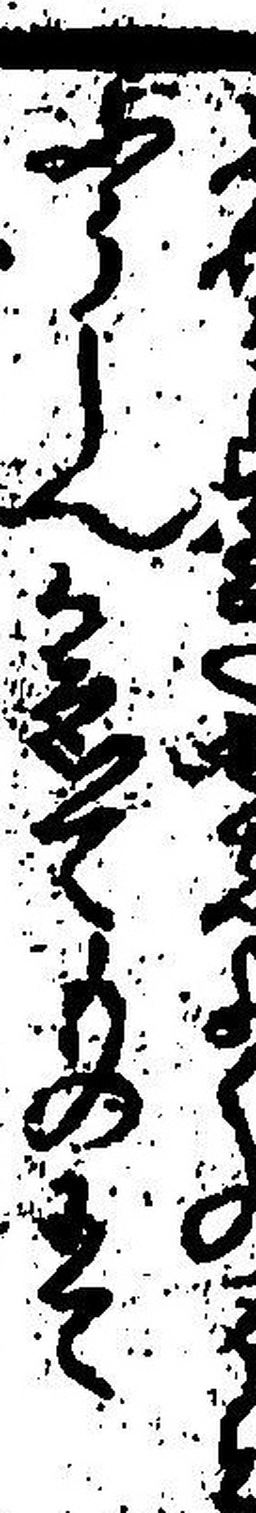ふうしんかゑてものにて
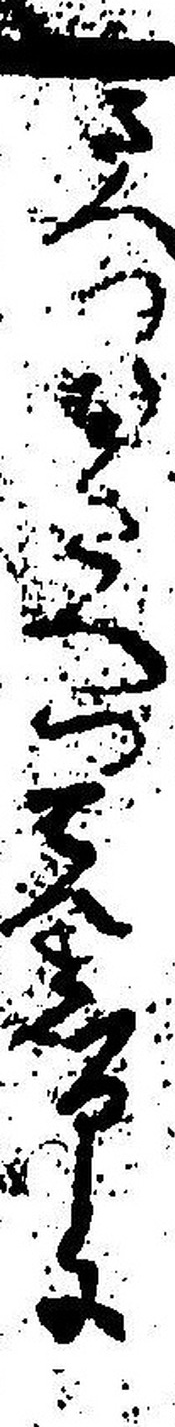さへつおさへつてんしるしに
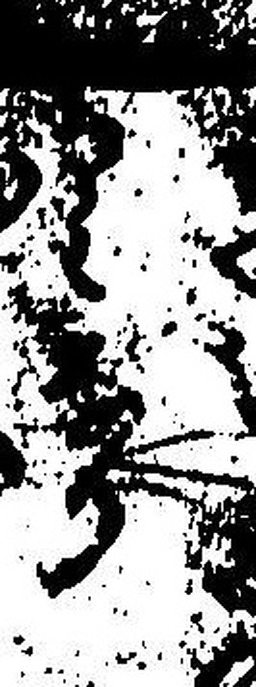かみなり
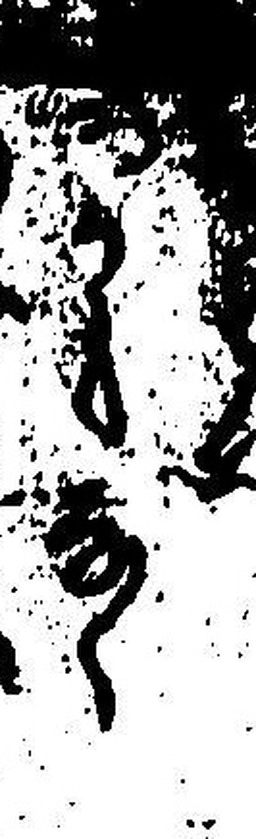つかもなく
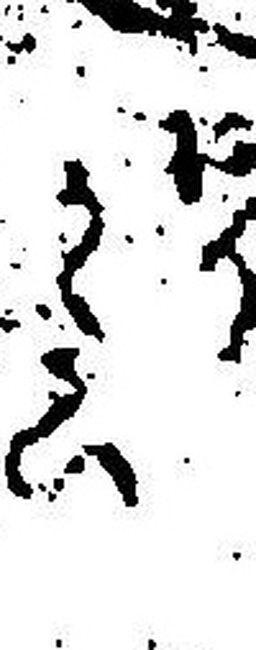かたい
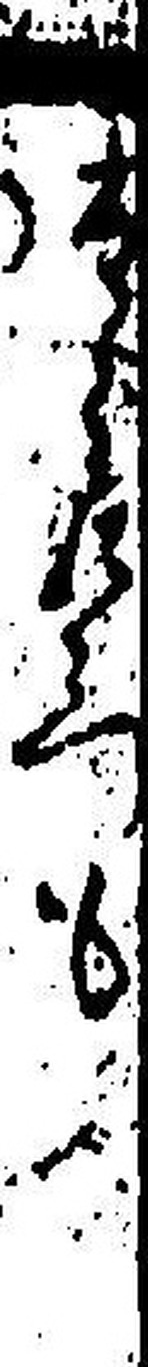太郎左衛門も
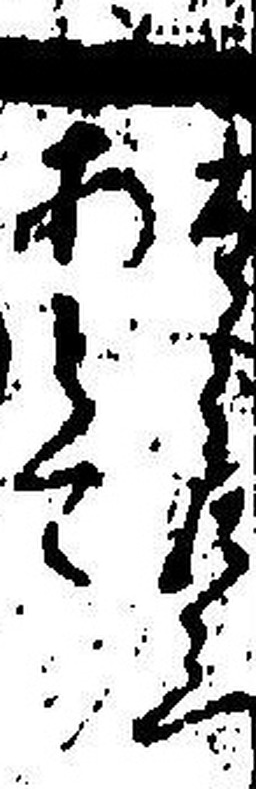あとて
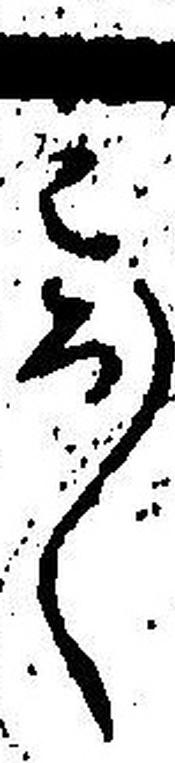ころ〳〵
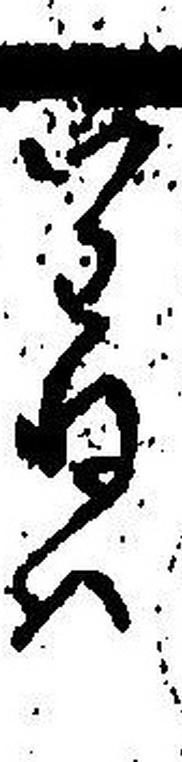いわねは
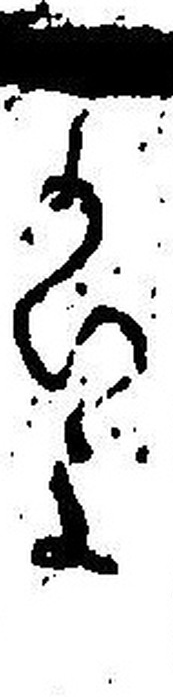よいよ
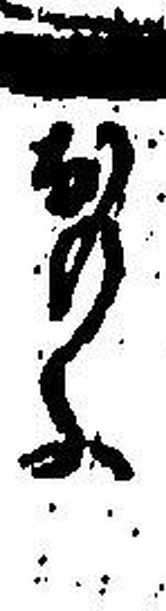おもふ
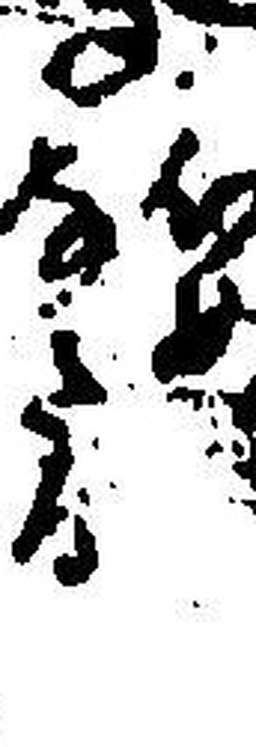なさる
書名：牡丹餅棚有 / 市場通笑作
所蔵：東京大学総合図書館 General Library in the University of Tokyo, JAPAN
